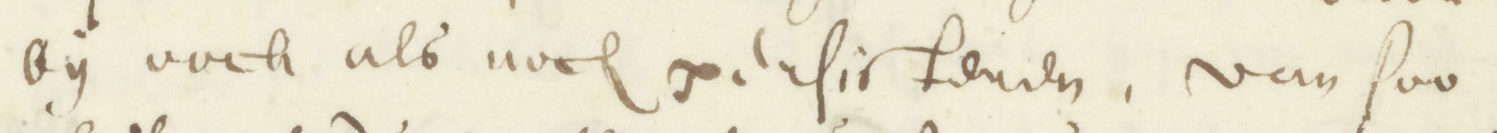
bij oock als noch persisteren, van soo
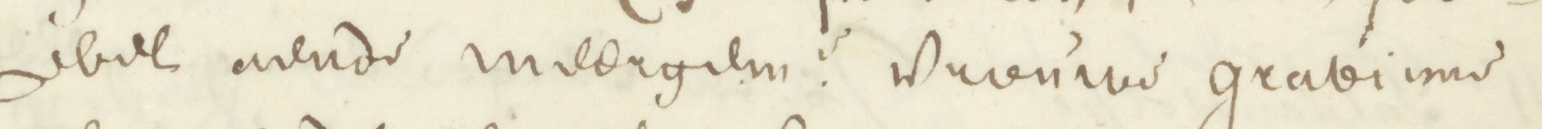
wel aende meergeme. Vrouwe gravinne
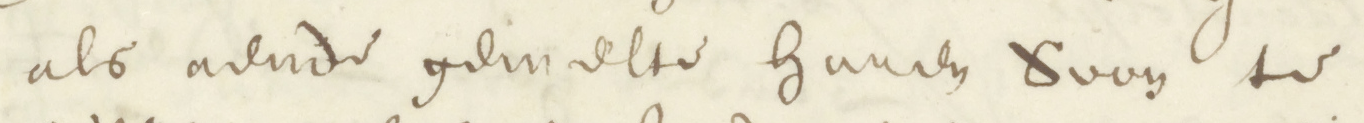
als aende gemelte haren Soon te
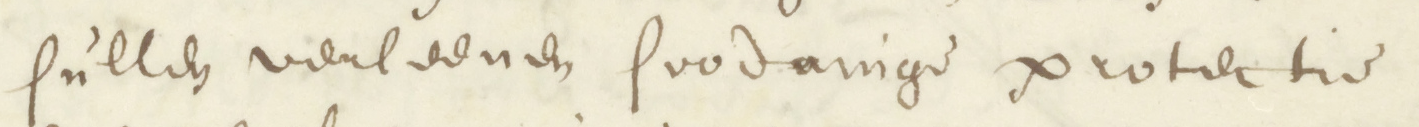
sullen verleenen soodanige protectie
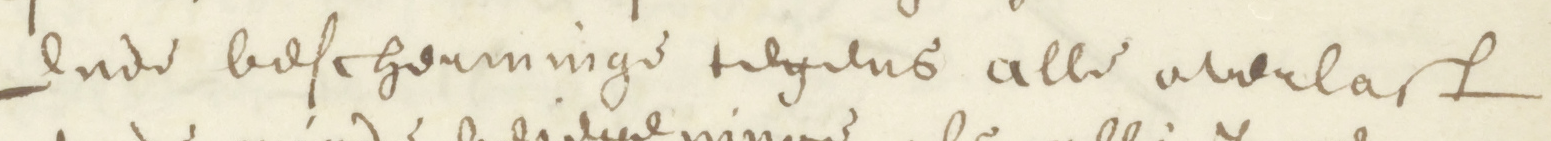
ende bescherminge tegens alle overlast
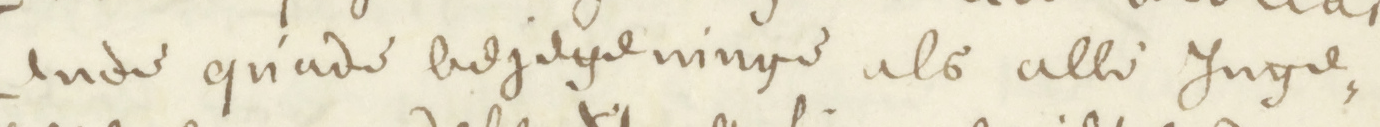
ende quade bejegeninge als alle Inge„
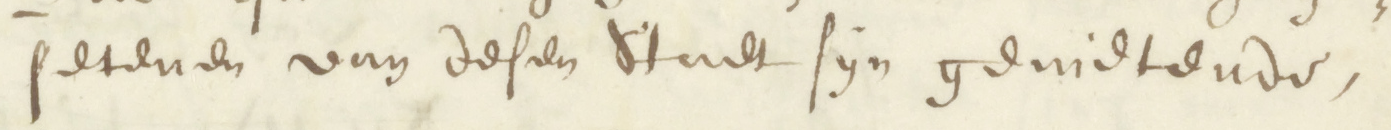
setenen van desen Staet sijn genietende.
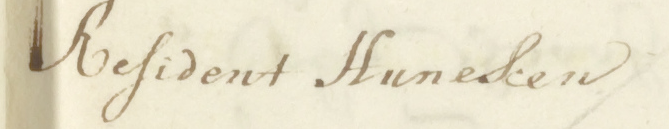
Resident Huneken
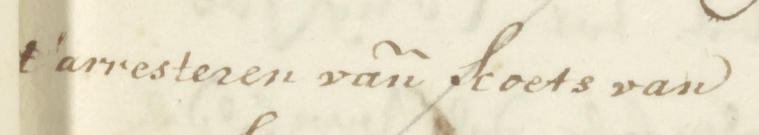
t' arresteren van koets van
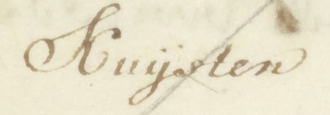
Kuijsten
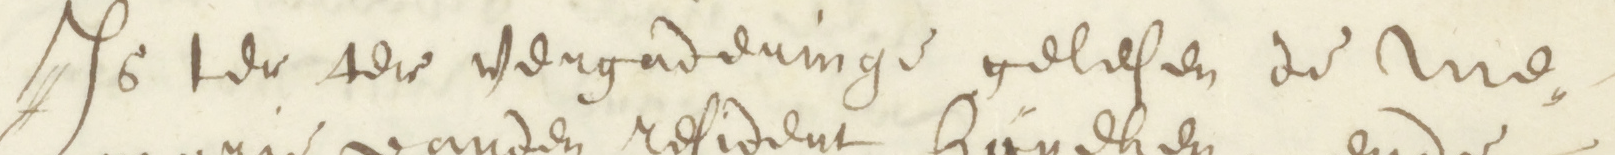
Is ter ter vergaderinge gelesen de me,,
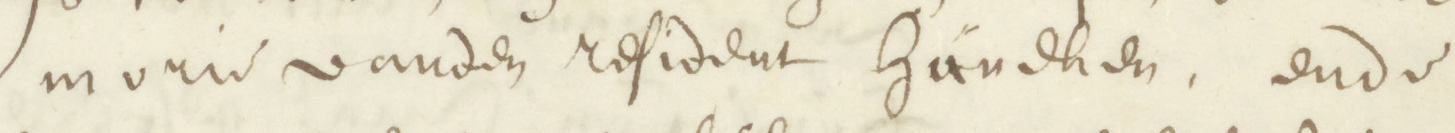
morie vanden resident huneken, ende
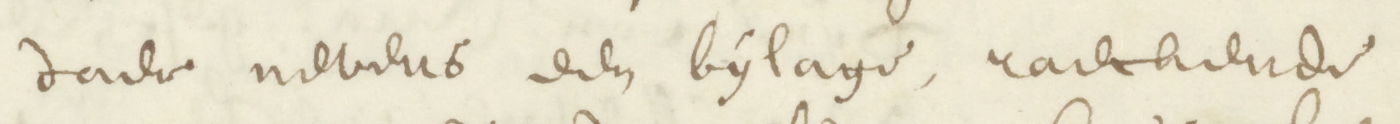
daer nevens een bijlage raeckende
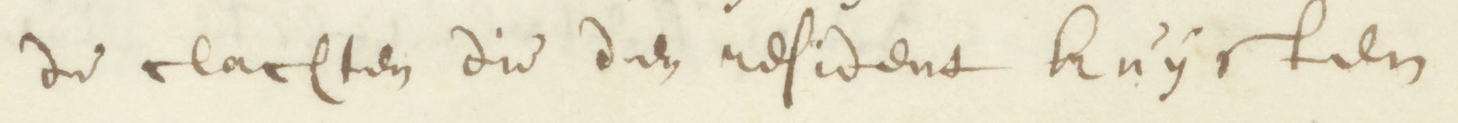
de clachten die den resident kuijsten
